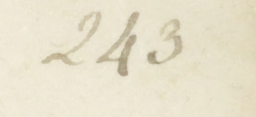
243
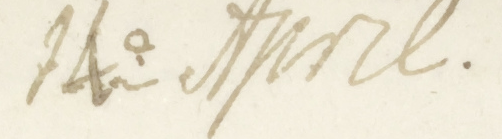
14e April.
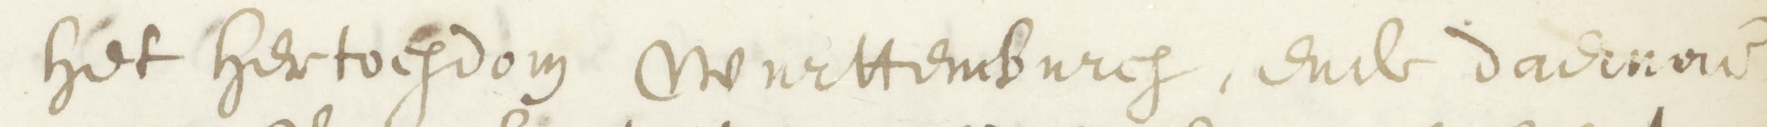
het hertochdom Wurttemburch, ende daernae
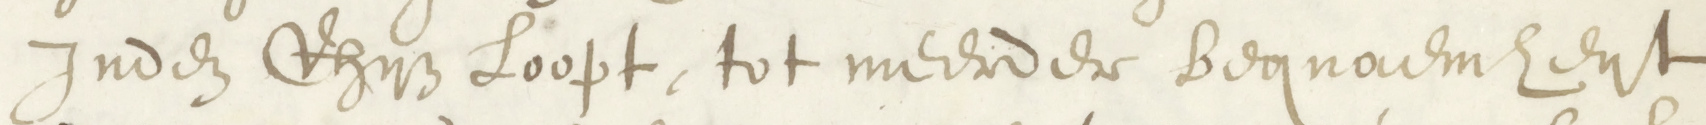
inden Rhyn loopt, tot meerder bequaemheyt
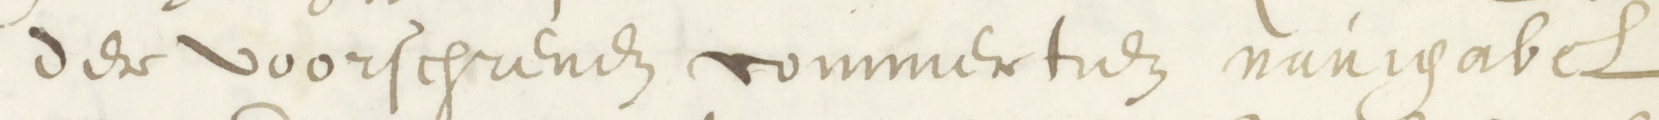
der voorschreven commertien nauigabel
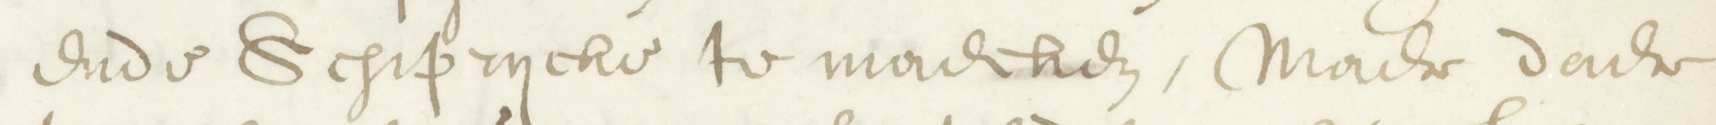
ende Schiprycke te maecken, maer daer
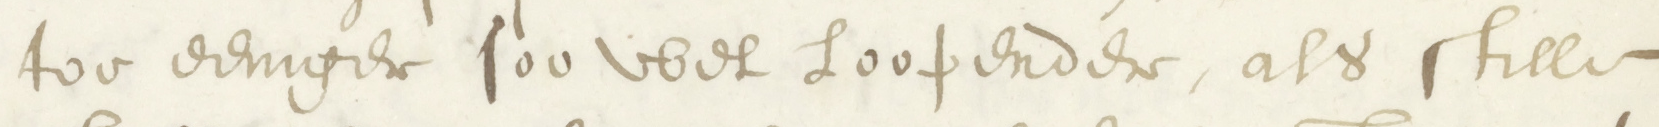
toe eeniger soo wel loopender, als stille
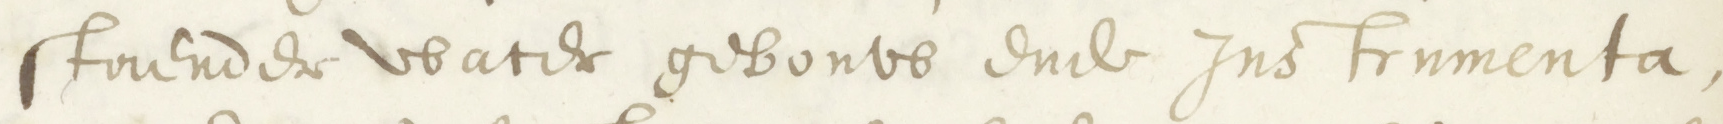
staender water gebouw ende Instrumenta,
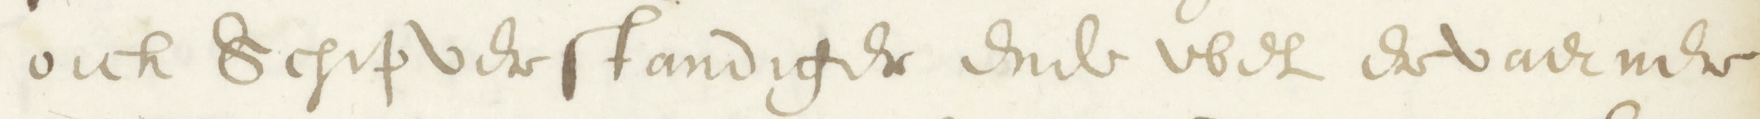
oick Schipverstandiger ende wel ervaerner
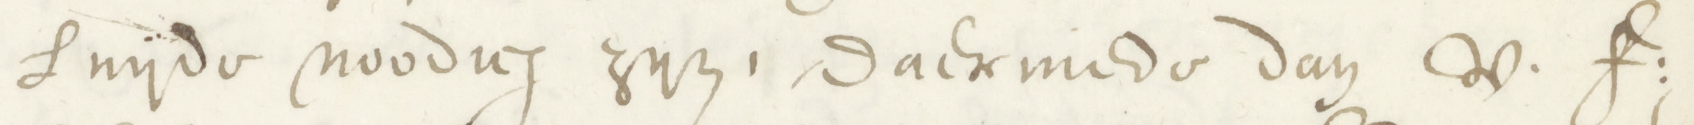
luijde noodich zyn, daermede dan U. F:
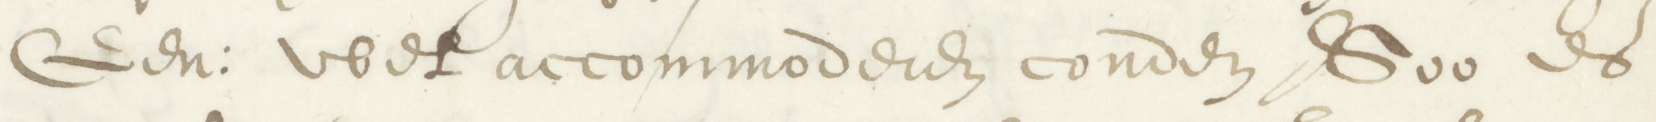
Gen: wel accommoderen conden, Soo es
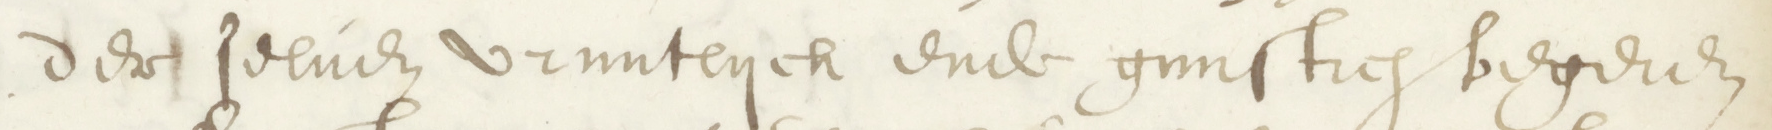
der seluen vruntlyck ende gunstich begeuen
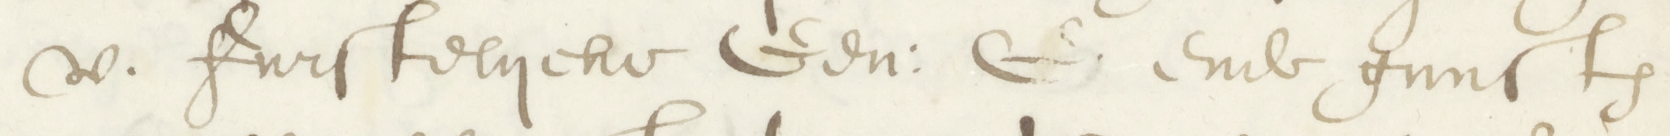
U. furstelycke Gen: G. ende gunsten
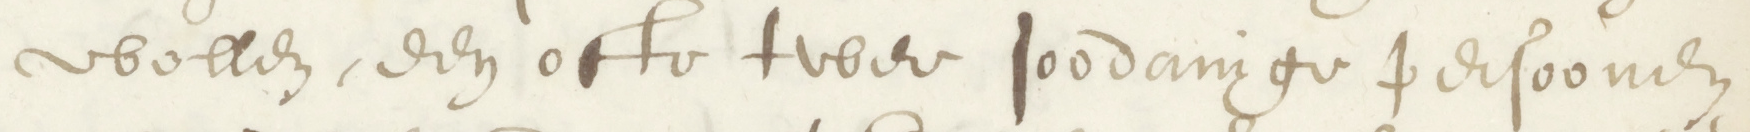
wollen, een ofte twee soodanige persoonen
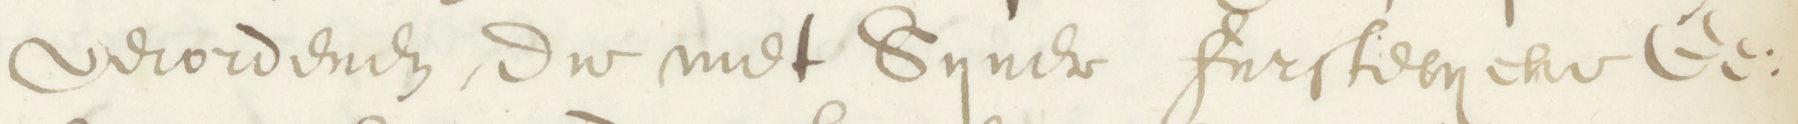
verordenen, die met Syner furstelycke Ge:
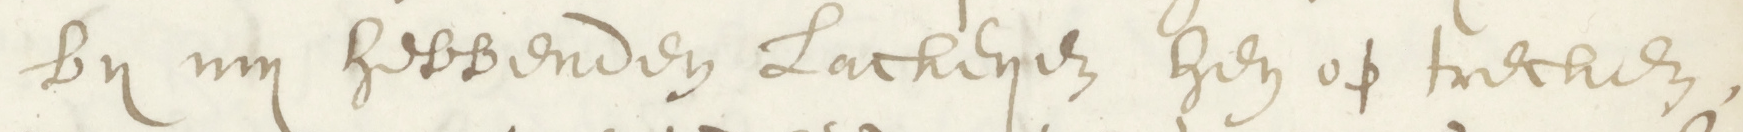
by my hebbenden Lackeyen hen op trecken,
